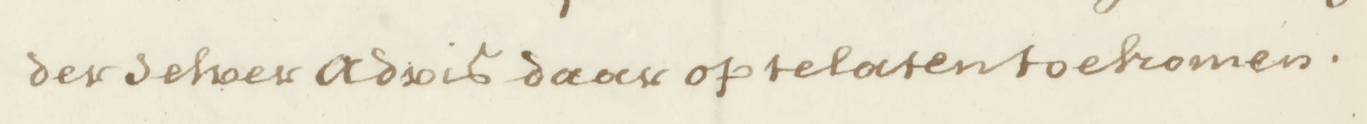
der selver Advis daar op te laten toekomen.
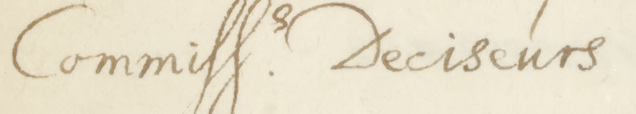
Commisss. Deciseurs
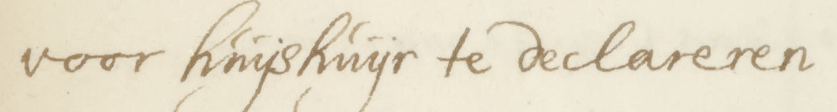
voor huijshuijr te declareren
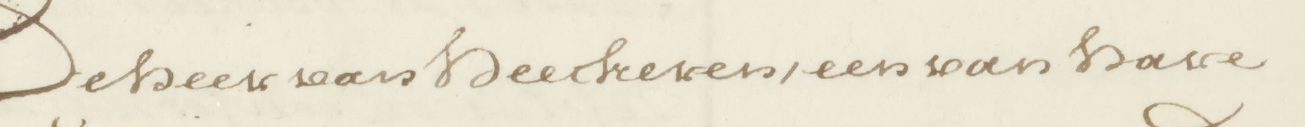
De heer van Heeckeren, een van hare
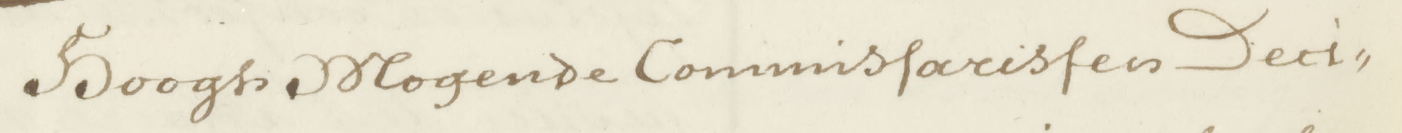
Hoogh Mogende Commissarissen Deci„
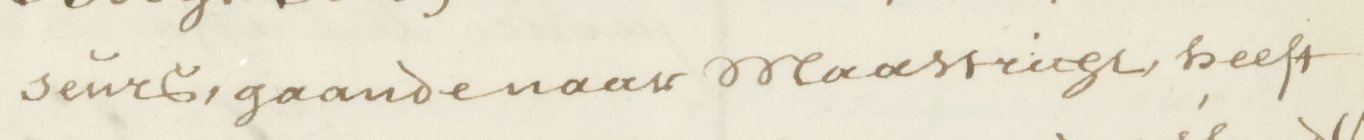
seurs, gaande naar Maastricht, heeft
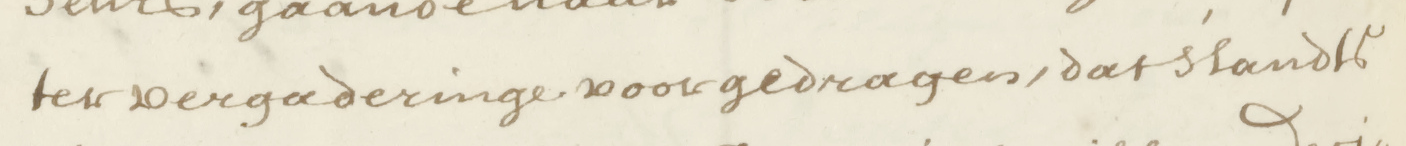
ter vergaderinge voorgedragen, dat s‛landts
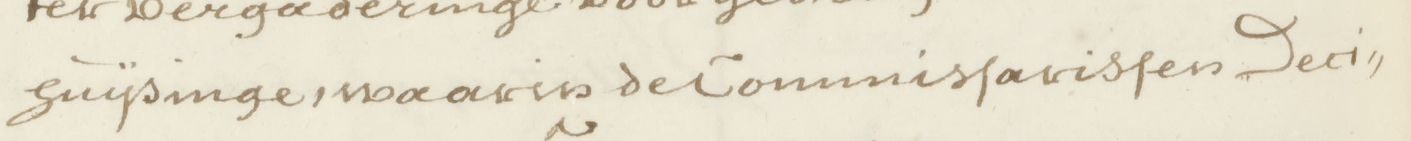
huijsinge, waarin de Commissarissen Deci„
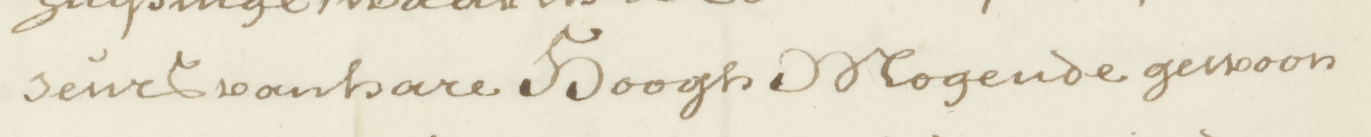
seurs van hare Hoogh Mogende gewoon
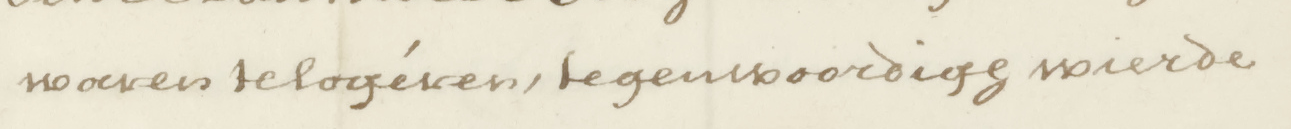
waren te logéren, tegenwoordigh wierde
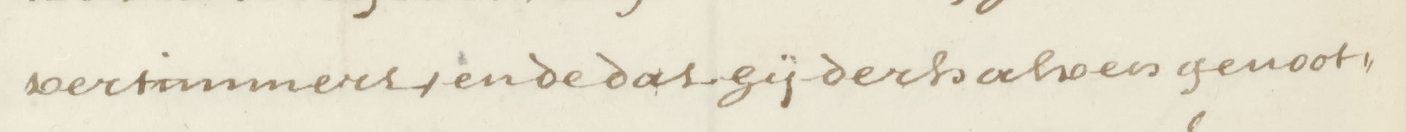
vertimmert, ende dat hij derhalven genoot„
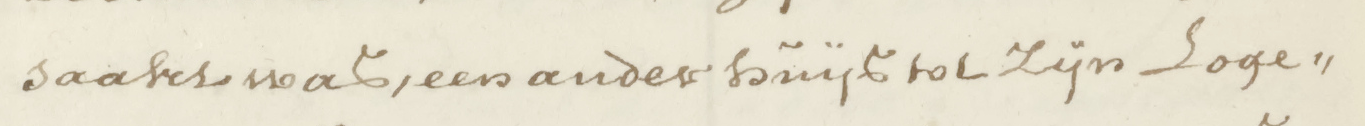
saakt was, een ander huijs tot zijn Loge„
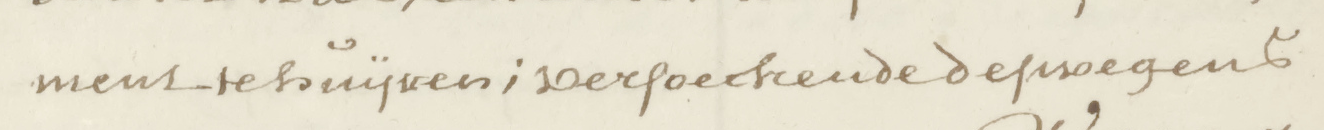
ment te huijren; versoeckende deswegens
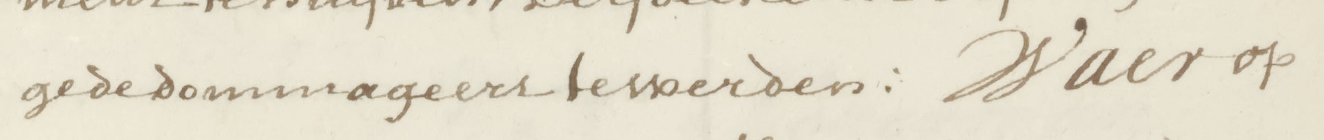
gededommageert te werden: Waerop
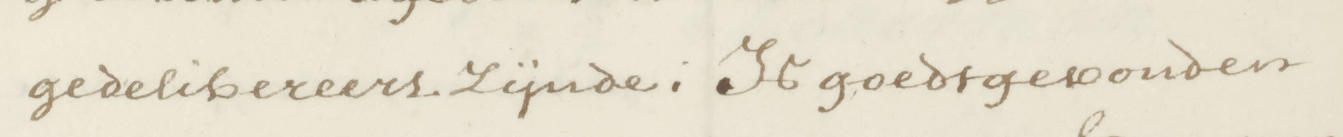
gedelibereert zijnde: Is goedtgevonden
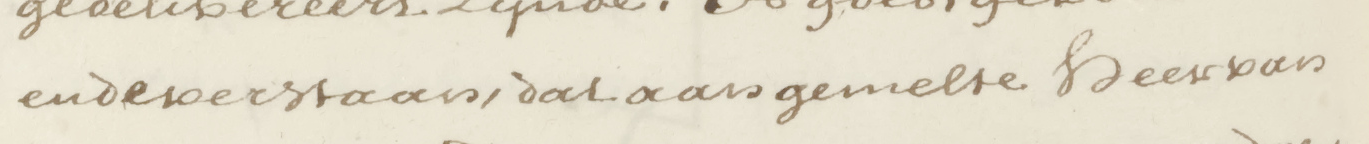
ende verstaan, dat aangemelte Heer van
